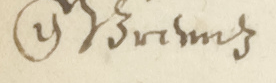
& Bremen
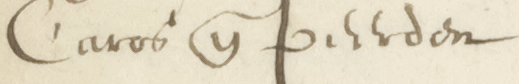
Caros & peerden
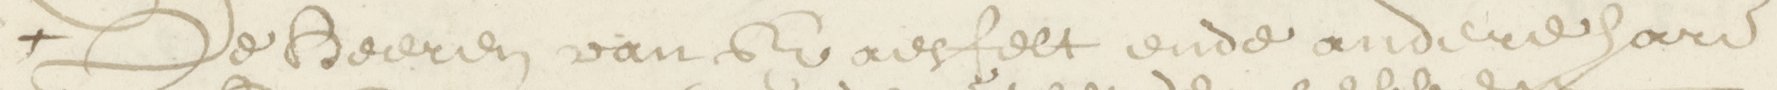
De heeren van Raesfelt ende andere hare
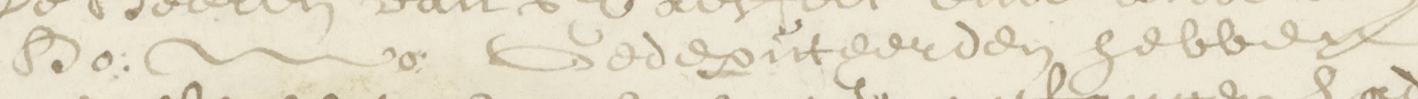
Ho:Mo: Gedeputeerde hebben——
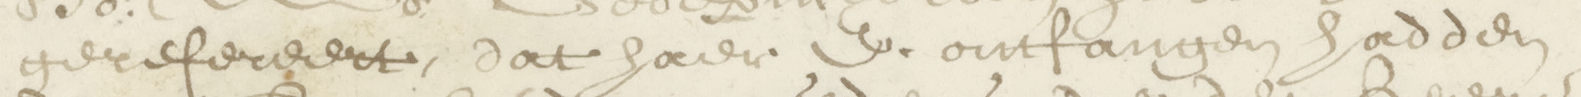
gerefereert, dat haer E. ontfangen hadden,
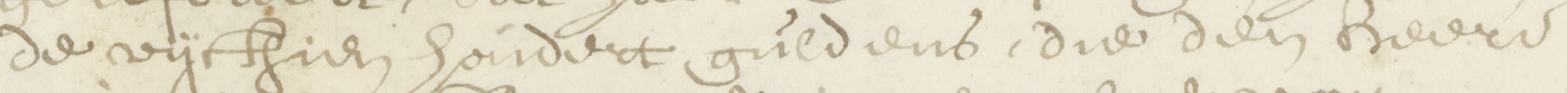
de vijfthien hondert guldens, die den heere
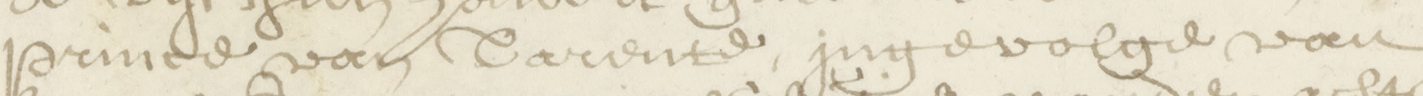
Prince van Tarente, ingevolge van
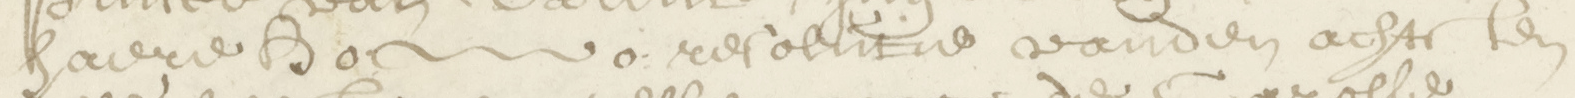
haere Ho:Mo: resolutie vanden achtsten
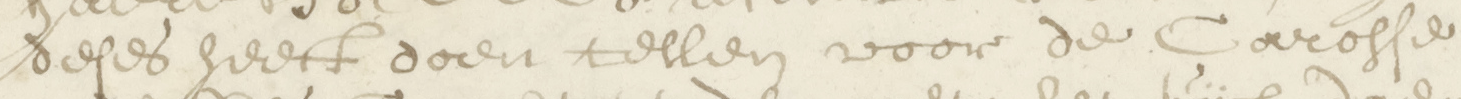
deses heeft doen tellen voor de Carosse
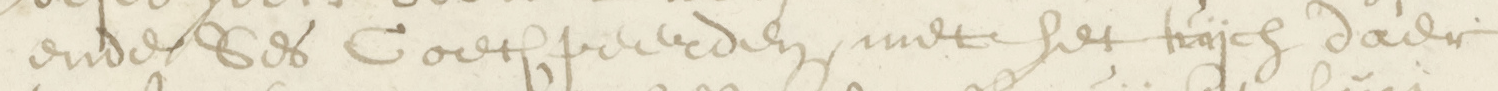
ende Ses Coetspeerden, met het tuijch daer
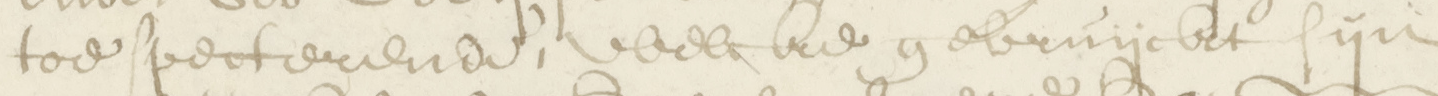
toe specterende, welcke gebruijckt sijn
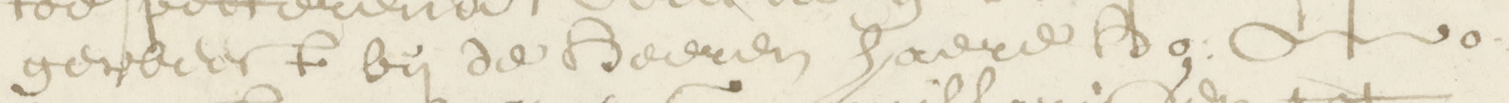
geweest bij de Heeren haere Ho:Mo:
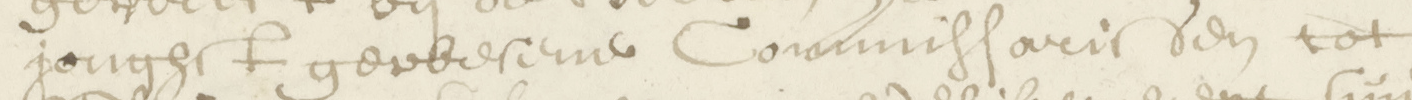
jonghst gewesene Commissarissen tot
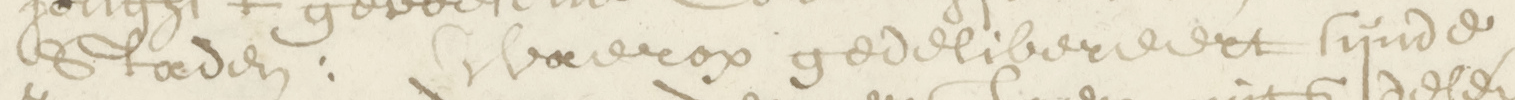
Staden: Waerop gedelibereert sijnde
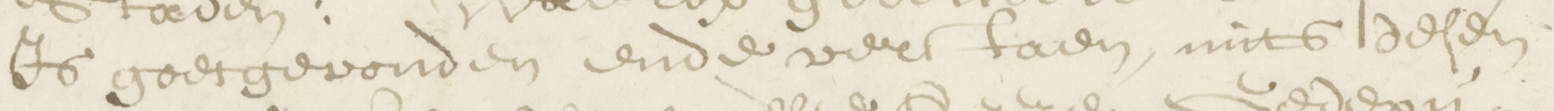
Is goetgevonden ende verstaen mits desen
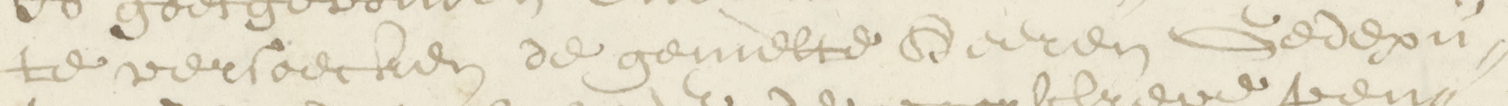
te versoecken de gemelte Heeren Gedepu„
